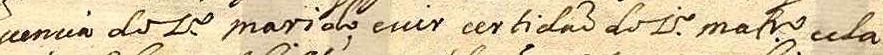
uençia do 1.o marido, e uir certidão do 1.o matr.o e cla
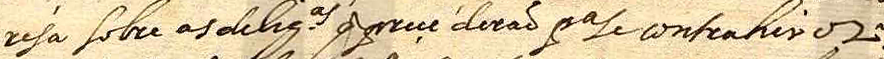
resa sobre as dilig.as q̄ preçederaõ p.a se contrair o 2.o
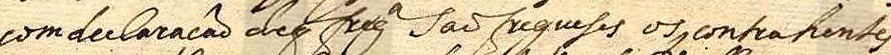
com declaração de q̄ freg.a saõ fregueses os contrahentes
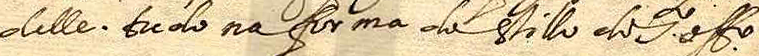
delle. tudo na forma do estillo do s.to off.o
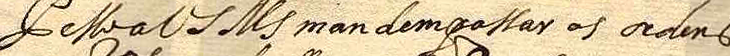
Pesso a V S Ms mandem passar as ordens̄
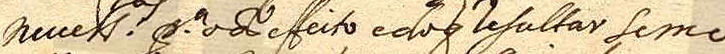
necçes.ras p.a o d̄o effeito, e do q̄ Resultar se me
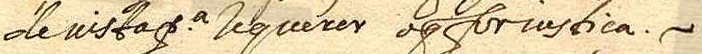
de uista p.a Requerer o q for iustiça.
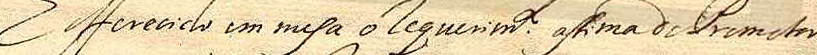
E offerecido em mesa o Requerim.to assima de Promotor
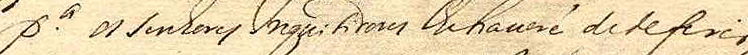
p.a os senhores Inquisidores lhe hauerẽ de deferir,
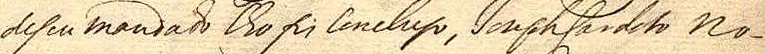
de seu mandado lho fis Concluso, Ioseph Cardoso No
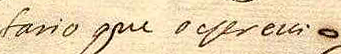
tario que o escrevi
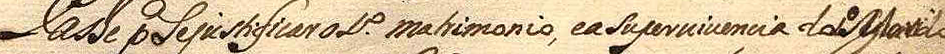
Passe p.a se justificar o 1.o matrimonio, e a superuiuençia do 1.o Marido
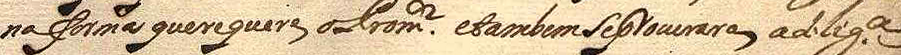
na forma que requere o Prom.or e também se procurara a dilig.a
